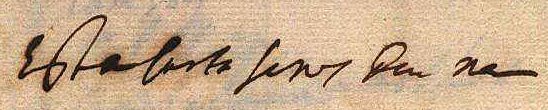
Esta carta se nos deu na
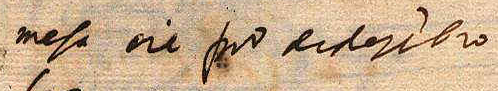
mesa oie pro de dezēbro
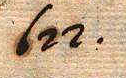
622.
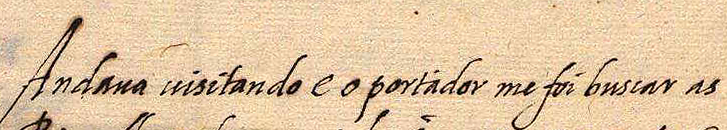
Andaua uisitando e o portador me foi buscar as
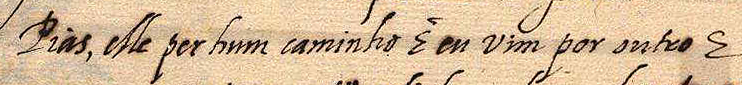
Pias, elle per hum caminho E eu vim por outro E
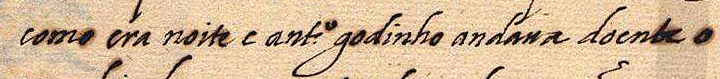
como era noite e anto godinho andaua doente o
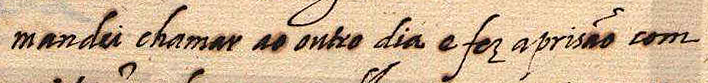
mandei chamar ao outro dia e fez a prisão com
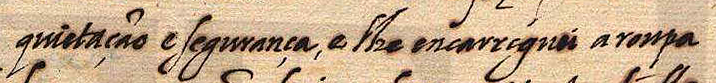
quietação e segurança, e lhe encarreguei a roupa
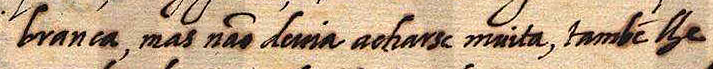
branca, mas não deuia acharse muita, tambē lhe
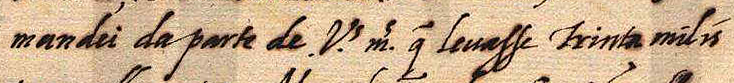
mandei da parte de V.s m.s q̄ leuasse trinta mil rs̄
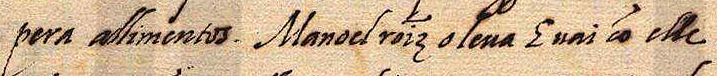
pera allimentos. Manoel roīz o leua E uai cō elle
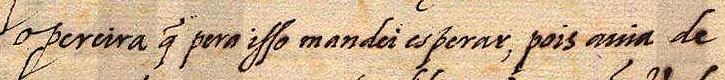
o pereira q̄ pera isso mandei esperar, pois auia de
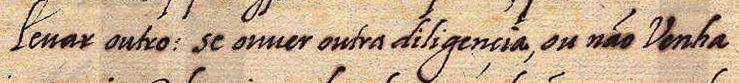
leuar outro: se ouuer outra diligencia, ou não Venha
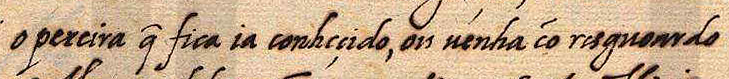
o pereira q̄ fica ia conhecido, ou uenha cō resguoardo
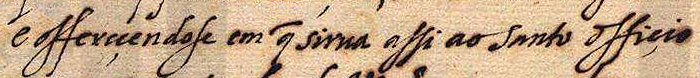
e offerecendose em q̄ sirua assi ao santo officio
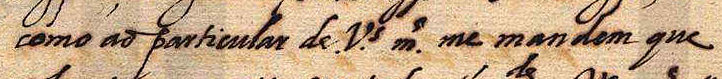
como ao particular de V.s m.s me mandem que
